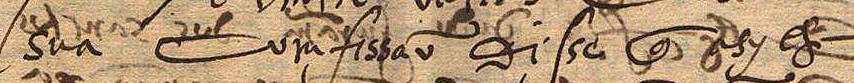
sua Comfissaõ disse q̄ asy lhe
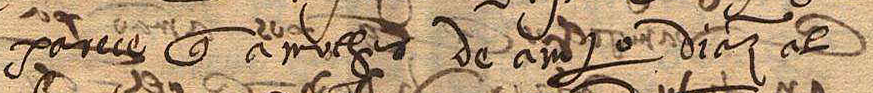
parece q̄ a molher de amto diaz al
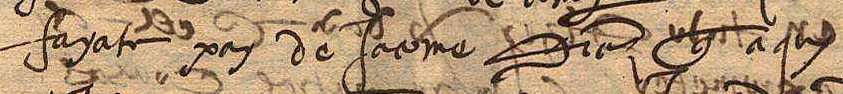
fayate pay de Jacome diaz q̄ aquy
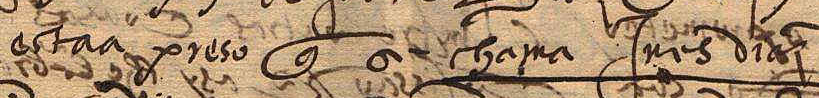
estaa preso q̅ se chama Jnes diaz
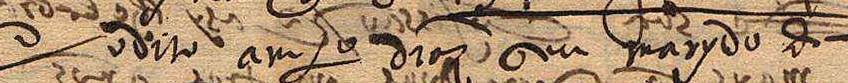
e o dito amto diaz seu marydo de
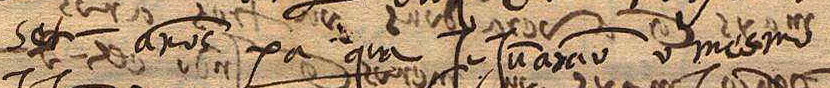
sete an̄os ꝑa qua JeJūarão o mesmo
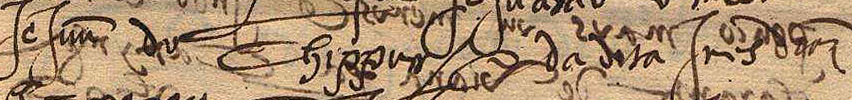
JeJuū do Chippur / e da dita Jnes diaz
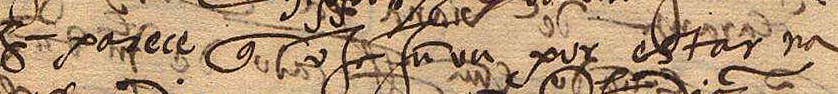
he parece q̄ o JeJūou por estar na
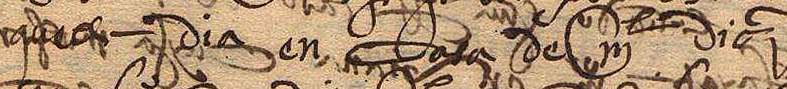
quelle dia en Casa de mel diaz
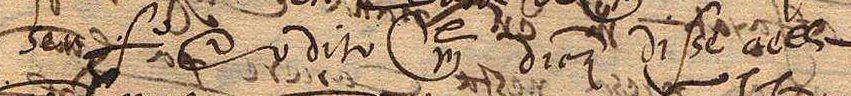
seu fo e o dito mel diaz disse a elle
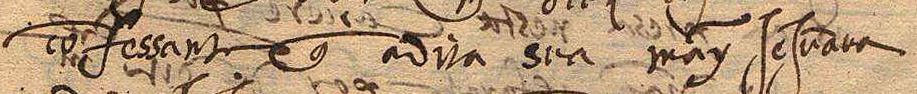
cōfessante q̅ a dita sua maȳ JeJūaua
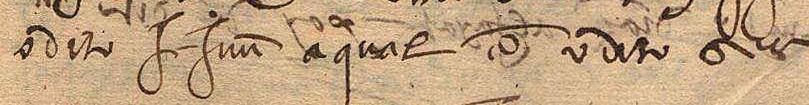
o dito JeJuū a quaL c̄o o dito seu
